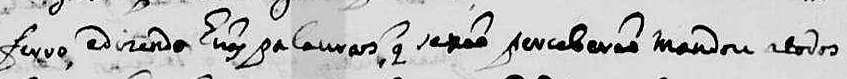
ferro, e dizendo huās palauras q̄ se naõ perceberaõ mandou a todos
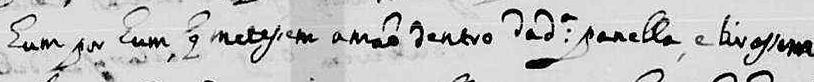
hum por hum, q̄ metessem a maõ dentro da da: panella, e tirassem
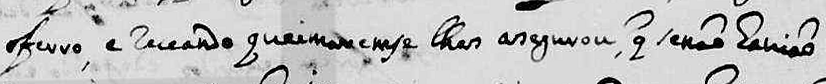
o ferro, e Receando queimaremse lhes asegurou, q̄ se não hauiaõ
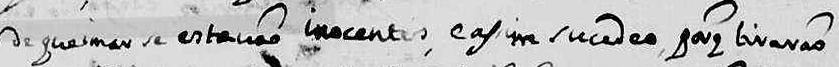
de queimar se estauaõ inocentes, e asim sucedeo porq̄ tiraraõ
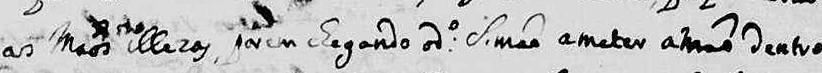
as maõs illezas, porem chegando o do: Simaõ a meter a maõ dentro
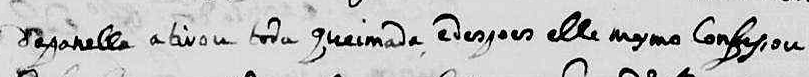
da panella a tirou toda queimada, e despoes elle mesmo Confessou
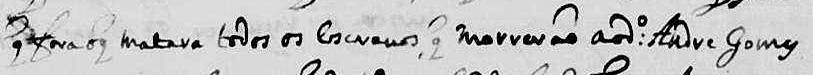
q̄ fora o q̄ matara todos os escrauos, q̄ morreraõ ao do: Andre Gomes
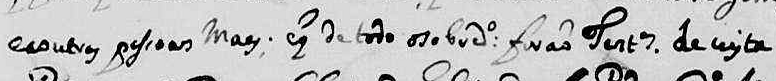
e a outras pessoas maes; e q̄ de todo o sobredo: foraõ Testas. de uista
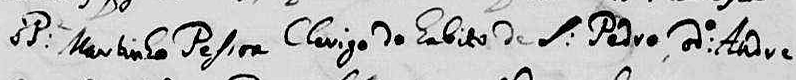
o P:e Martinho Pessoa Clerigo do habito de S: Pedro, o do: Andre
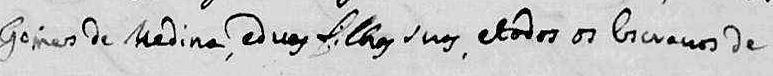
Gomes de Medina, e duas filhas suas, e todos os Escrauos de
